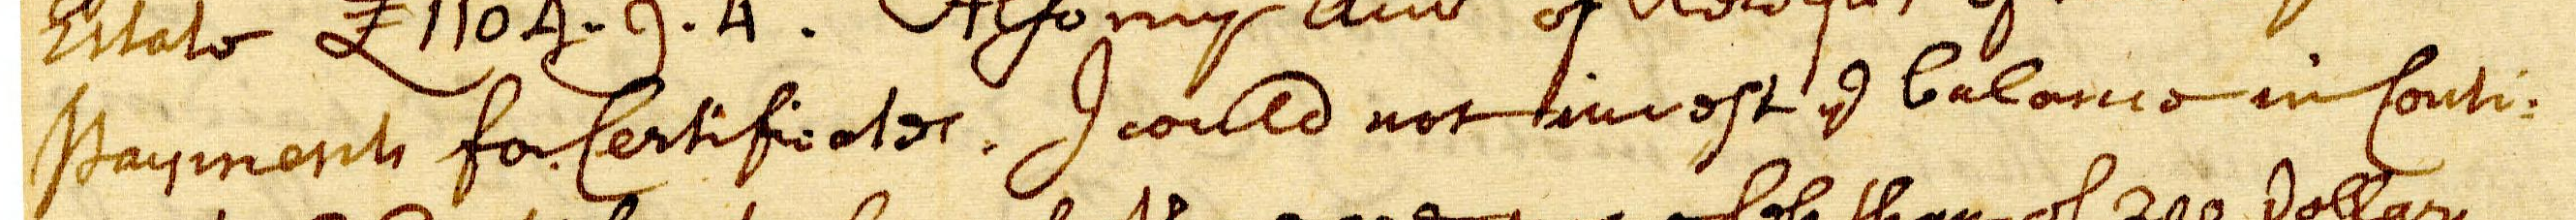payments for Certificates, I could not invest y^e balance in Conti:
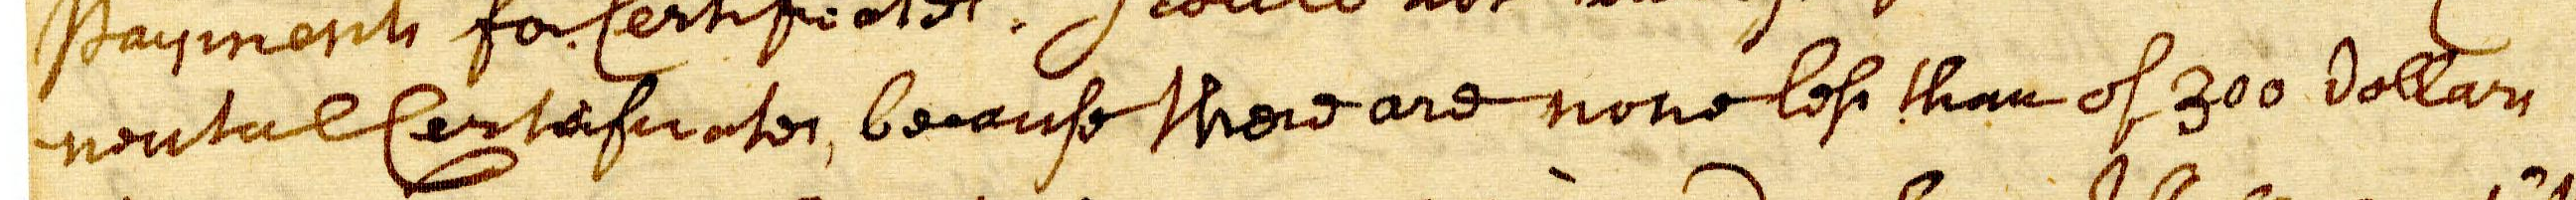-nental Certificates, because there are none loss than of 300 dollars
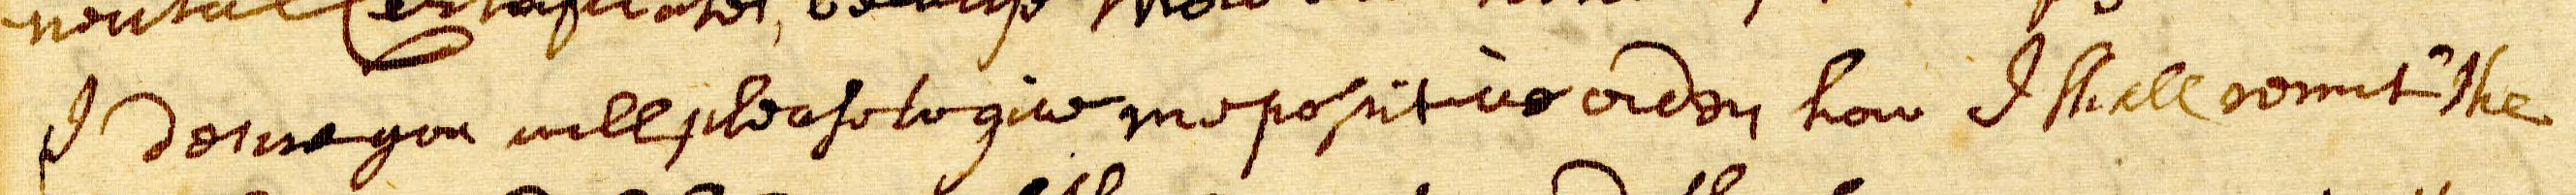I desire you will please to give me positive order how I shall remit the
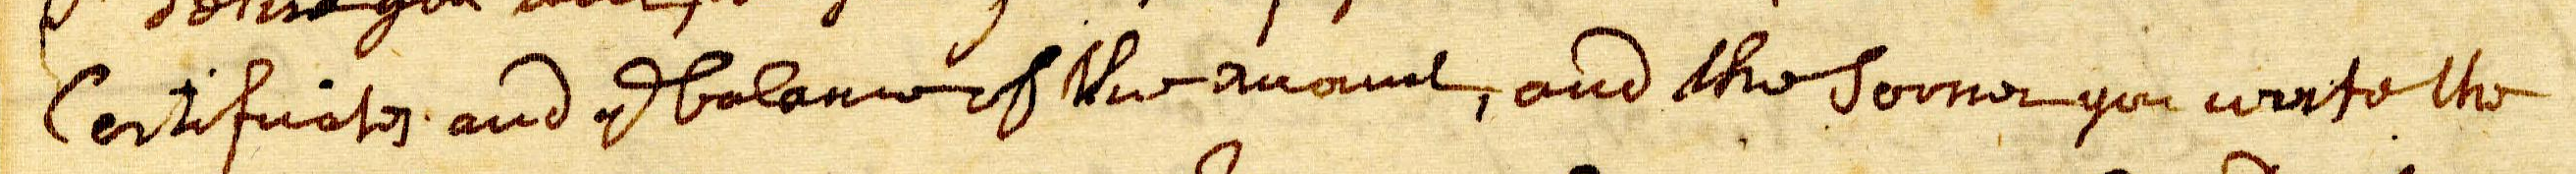Certificates and y^e balance of the amount, and the sooner you write the
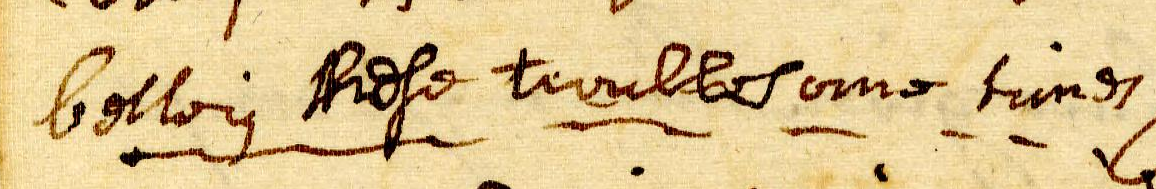better in these troublesome times
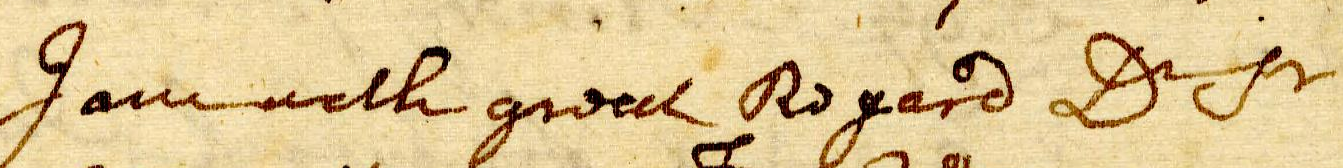I am with great Regard D^r Sir
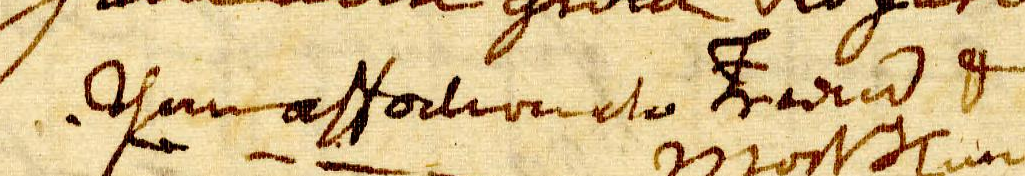Your affectionate Friend &
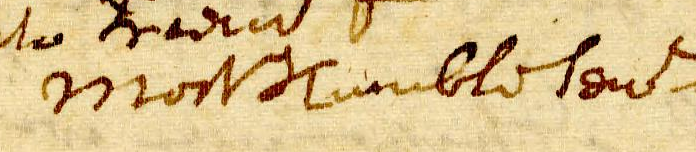Most Humble Serv^t
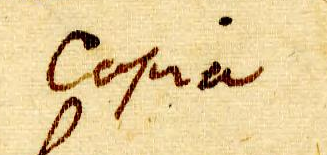Copia
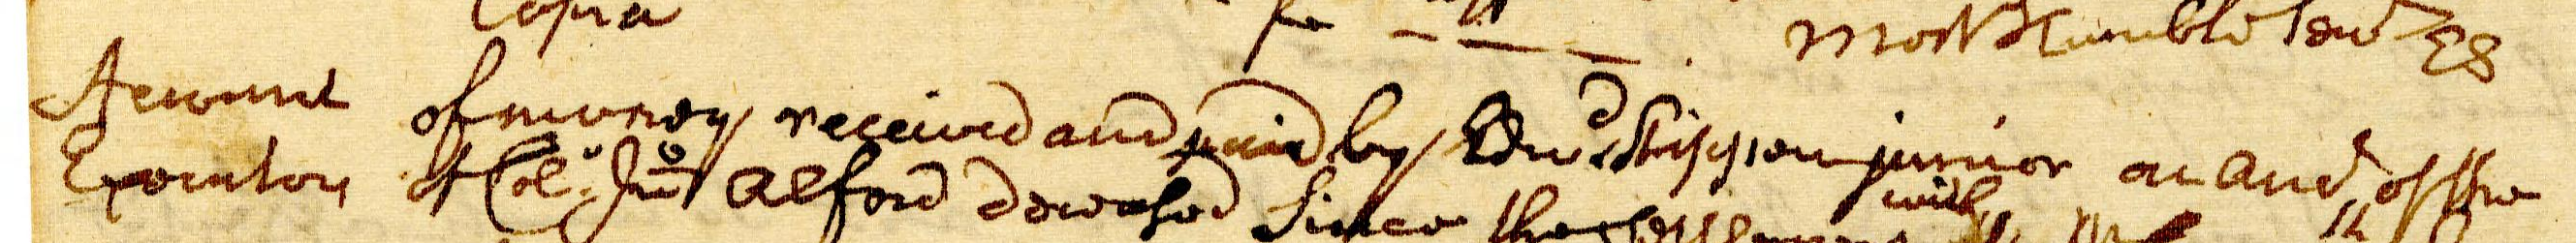Amount of money received and paid by Edw^d Shippen junior on Acco^t of the
